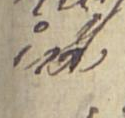-in
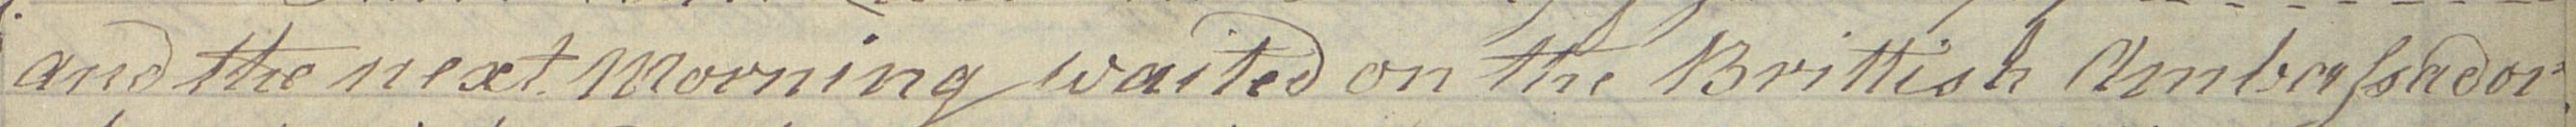and the next morning waited on the Brittish Ambassador
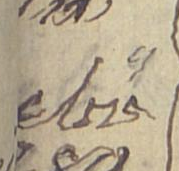ober
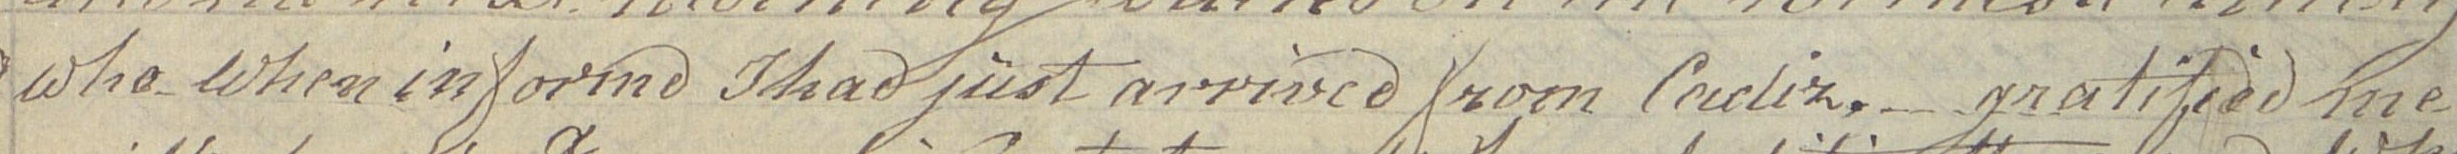who when informd I had just arrived from Cadiz, gratified me
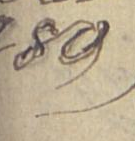-80
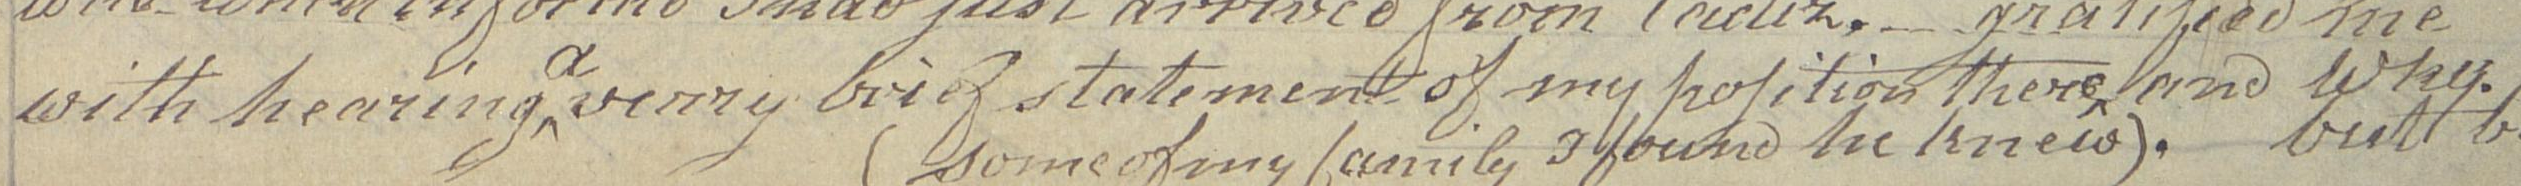with hearing ^ verry brief statement of my position there and Why
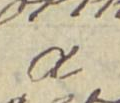a
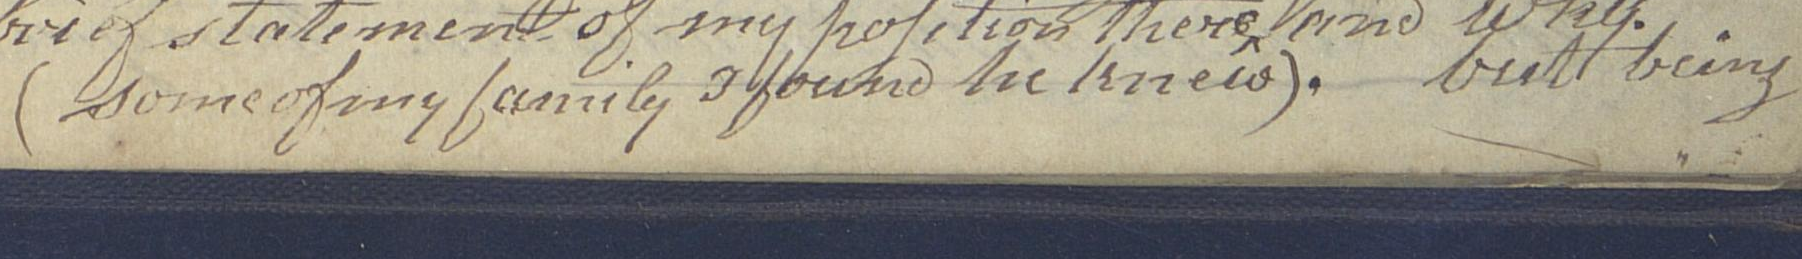(some of my family I found he knew). butt being
